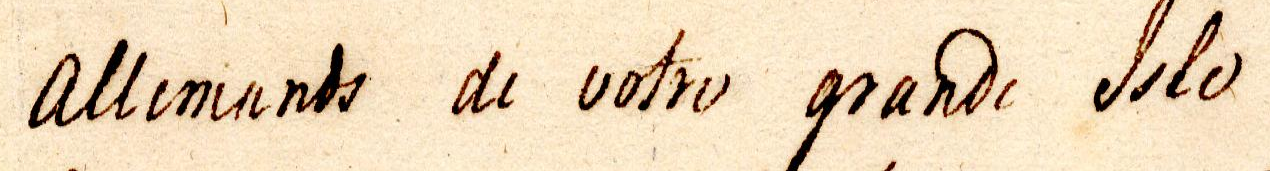Allemands de votre grande Isle
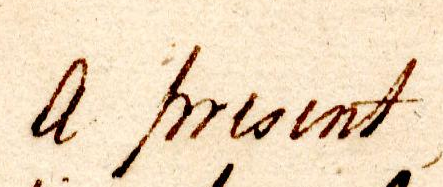A present
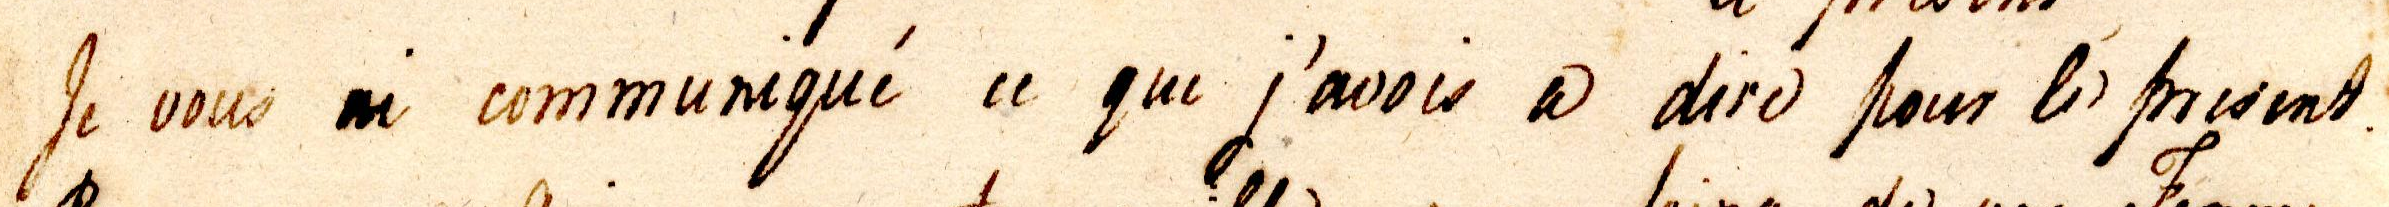je vous ai communiqué ce que j'avois a dire pour le present
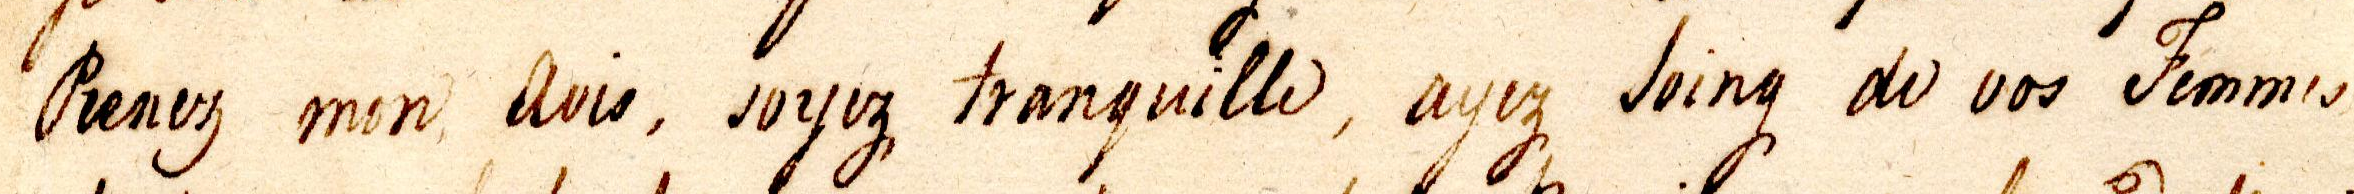Prenez mon Avis, soyez tranquille, ayez Soing de vos Femmes
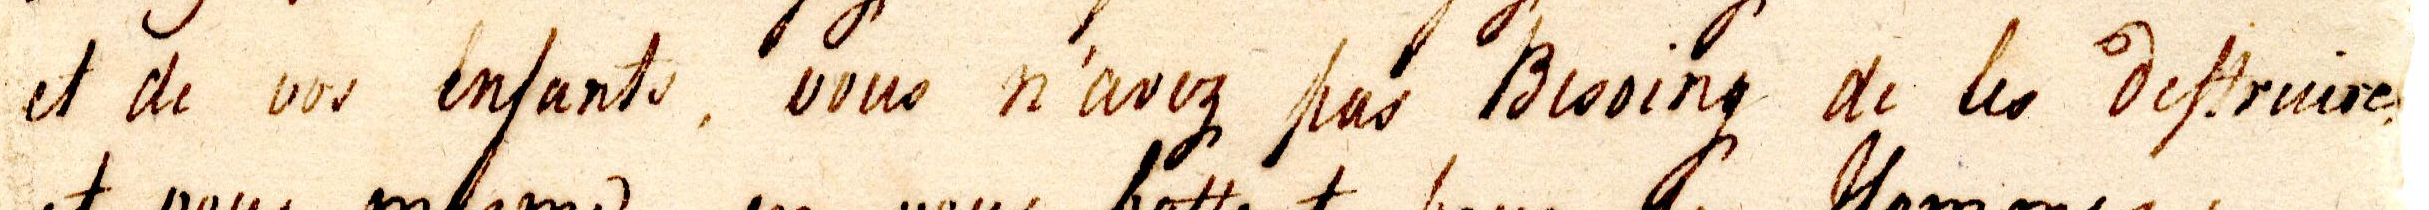et de vos Enfants, vous n'avez pas Besoing de les destruire
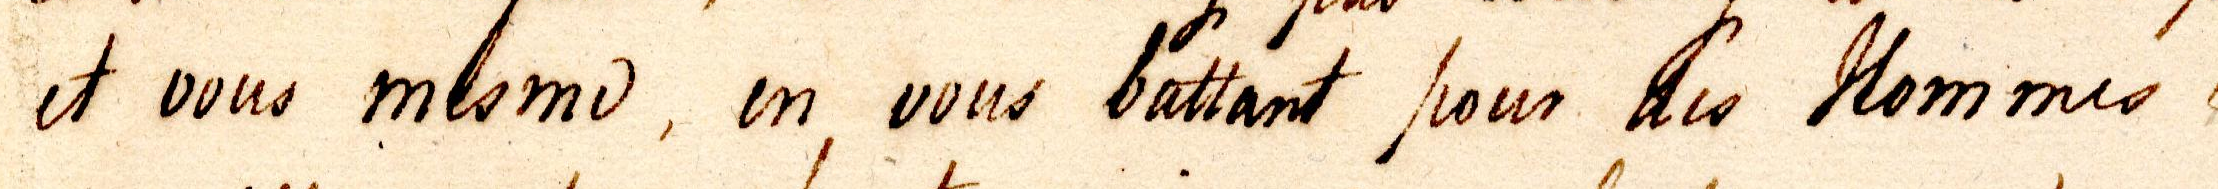et vous mesme, en vous battant pour des Hommes
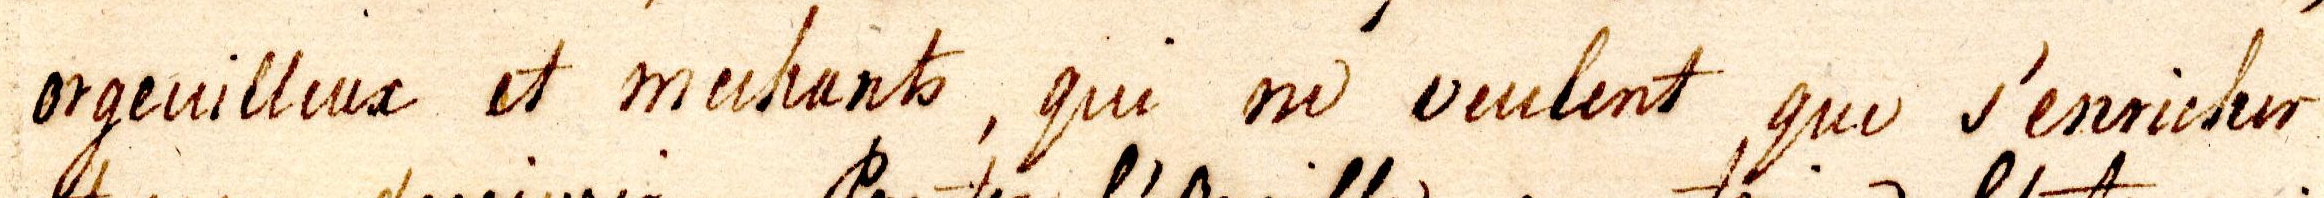orgeuilleux et mechants, qui ne veulent que s'enricher
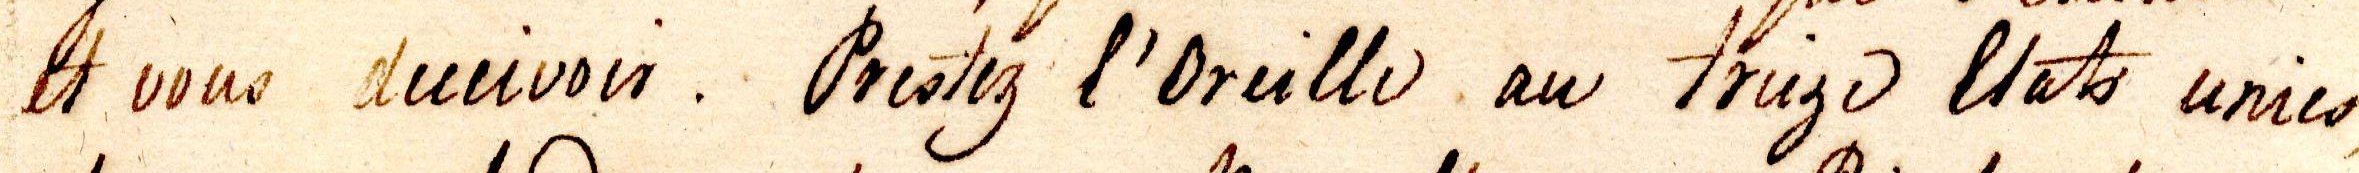et vous deceivoir. Prestez l'Oreille au trize Etats unies
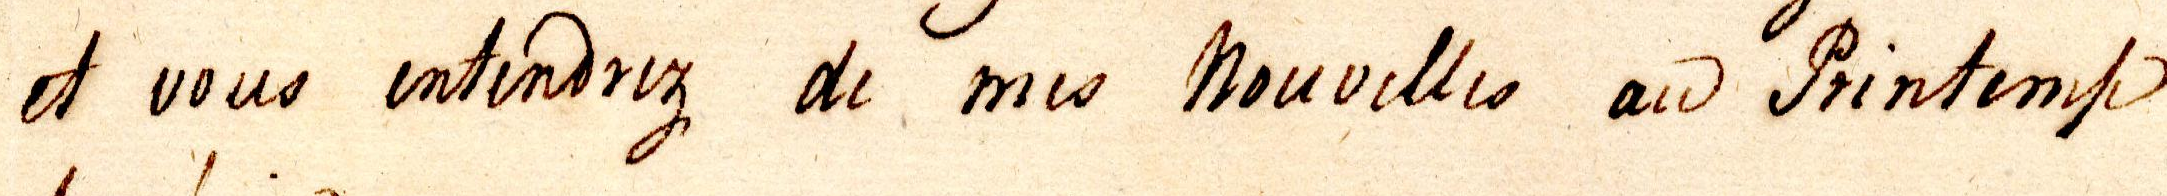et vous entendrez de mes Nouvelles au Printemp
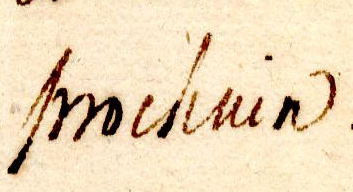prochain.
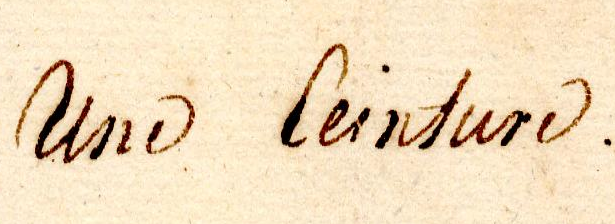Une Ceinture
